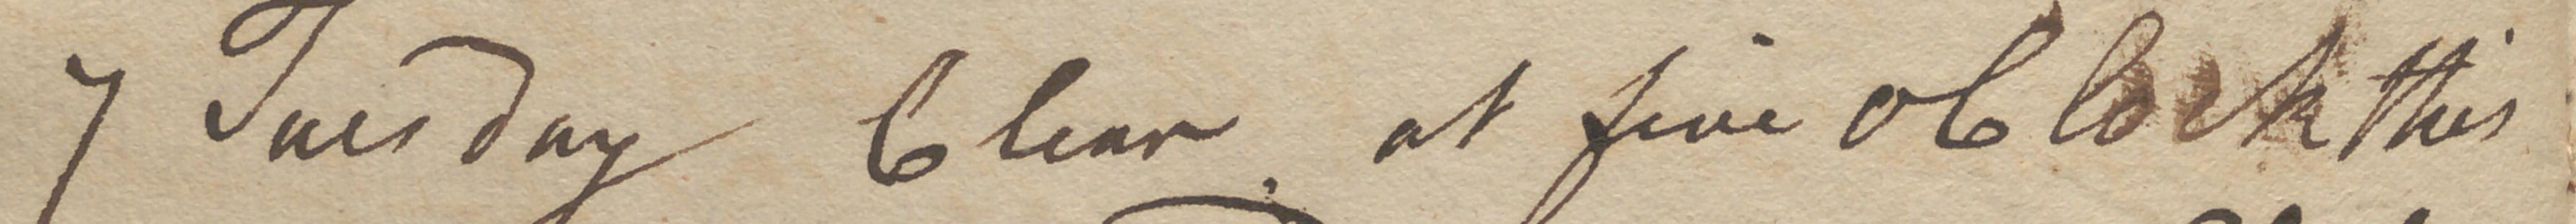7 Tuesday Clear at five oClock this
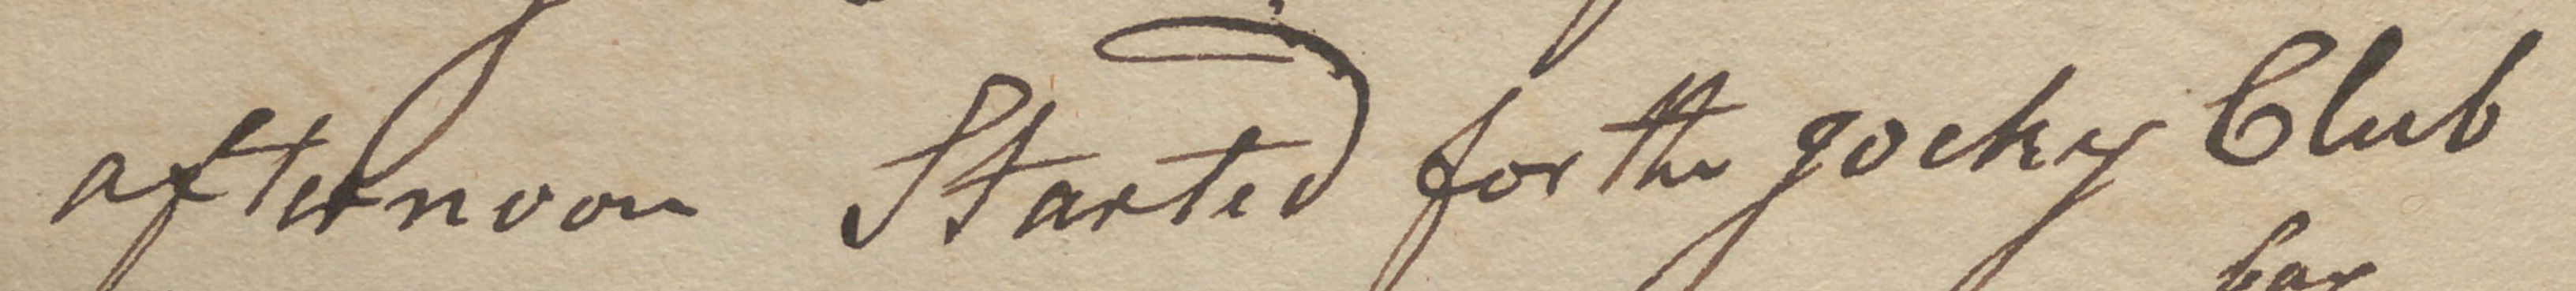afternoon Started for the jocky Club
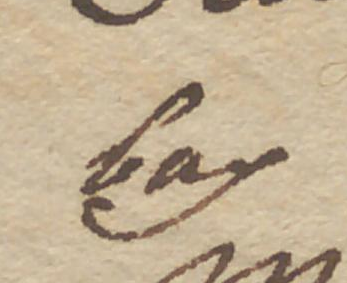bay
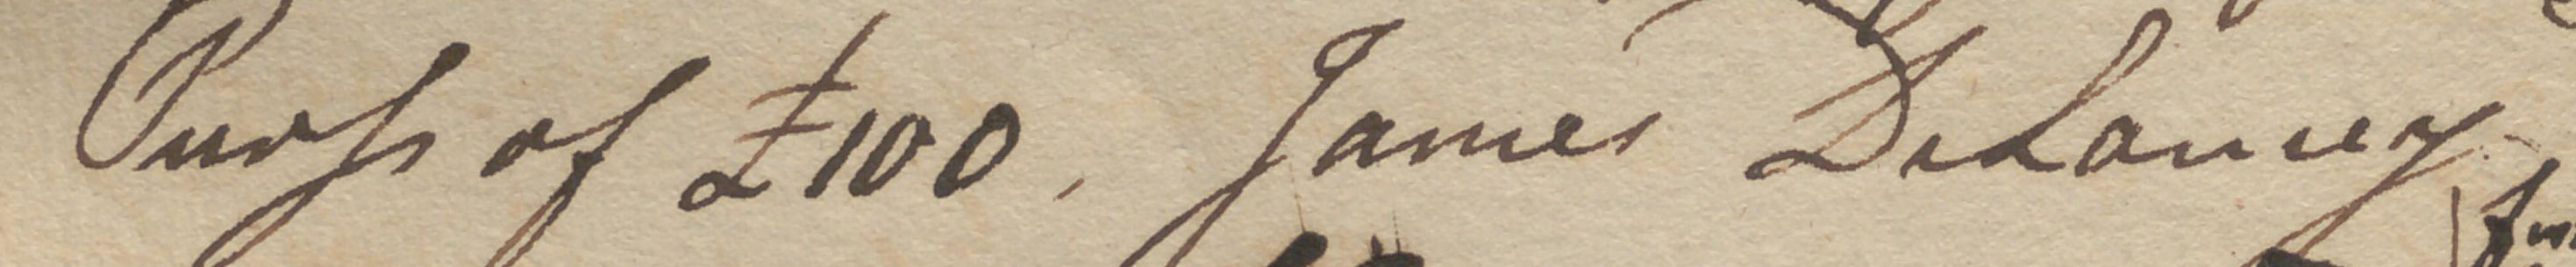Purss of £100. James DeLancey
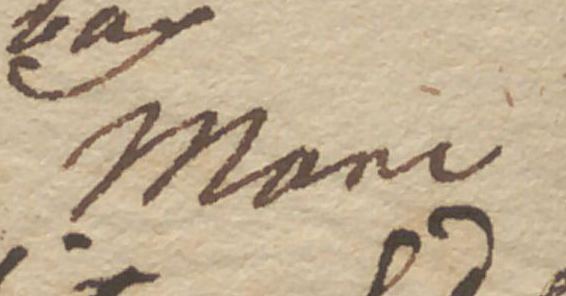Mare
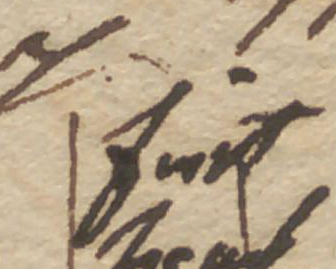first
